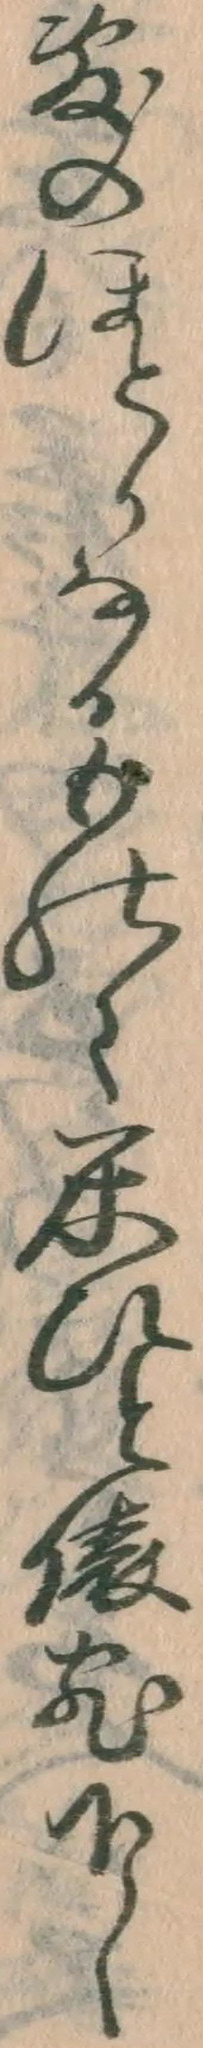敷のほとりなるものに米ひと俵宛下し
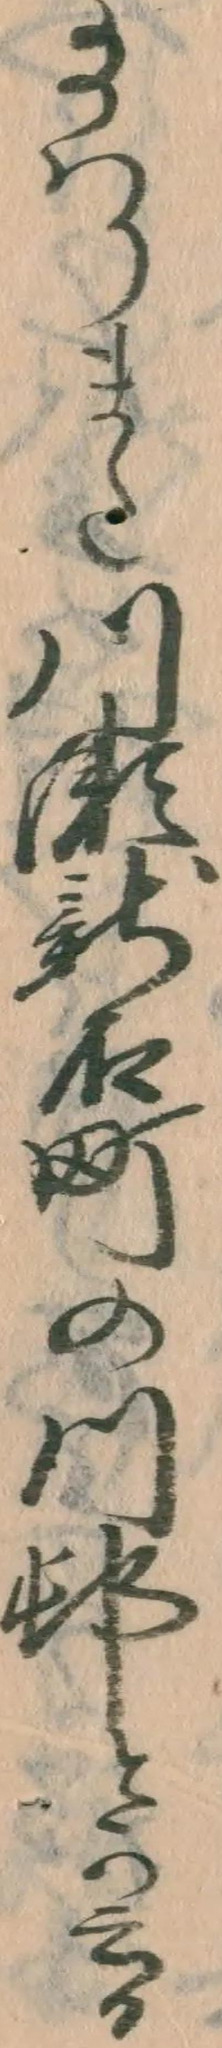玉ハりまし川瀬新石町の川邨とか云る
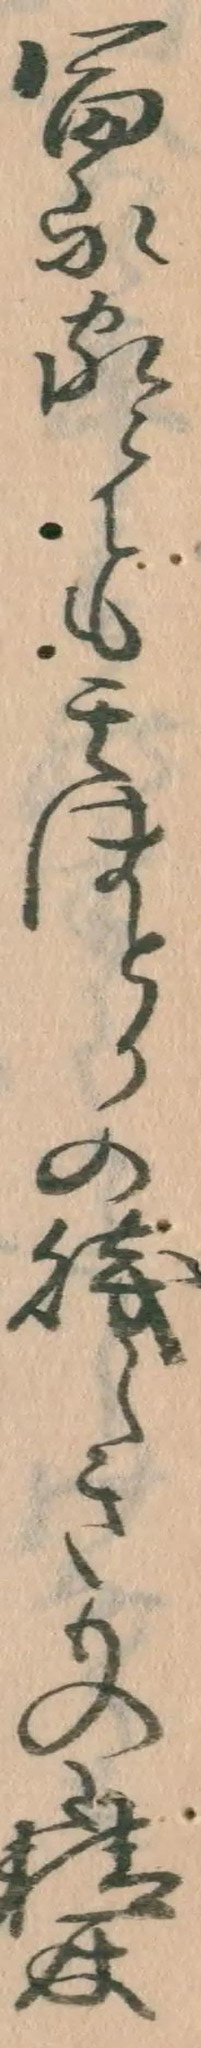冨る家ニても其ほとりの賤しきものに精米
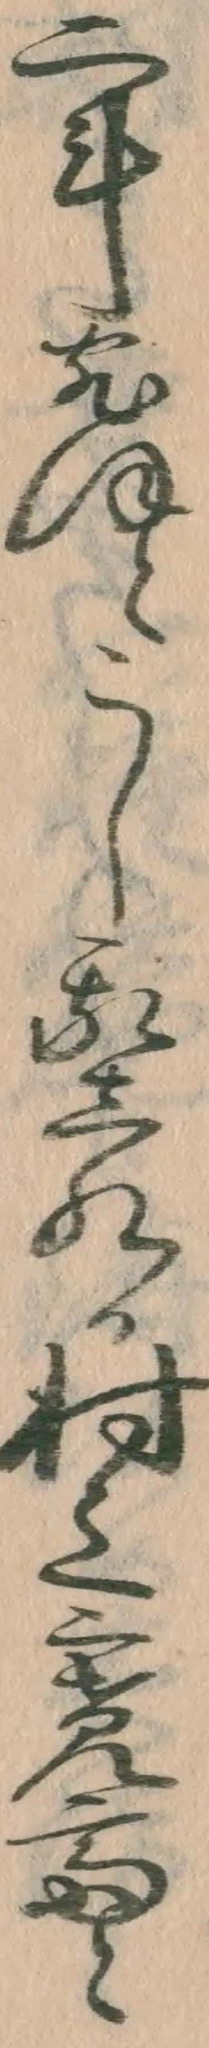二斗宛ほとこし我しれる村上寛斎と
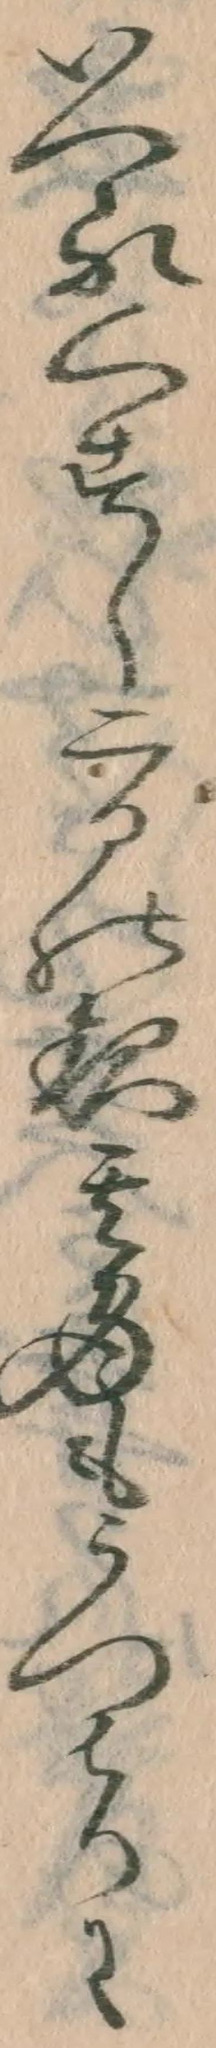いへるくすし二日の夜其身もうつはりに
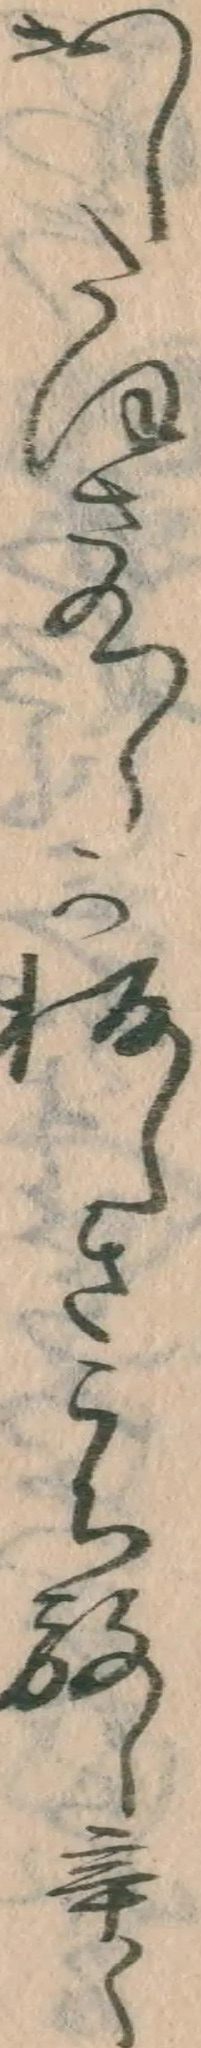おしたほされしか板しきうち放し辛く
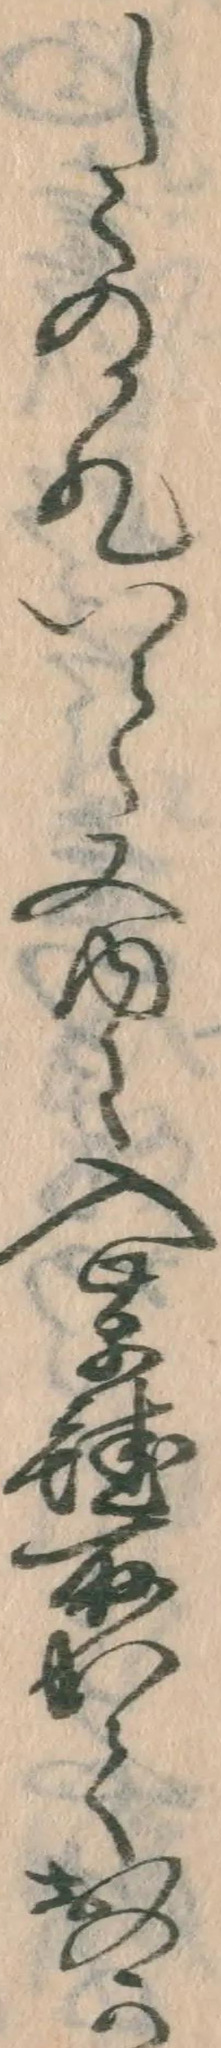してのかれいて又内に入草鞋取出ておのか
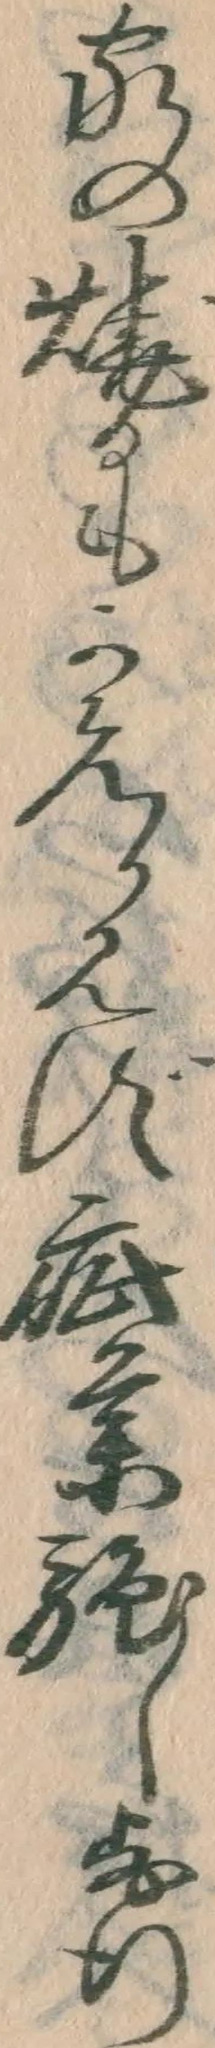家の燒るもかえり見ず疵薬施し歩行
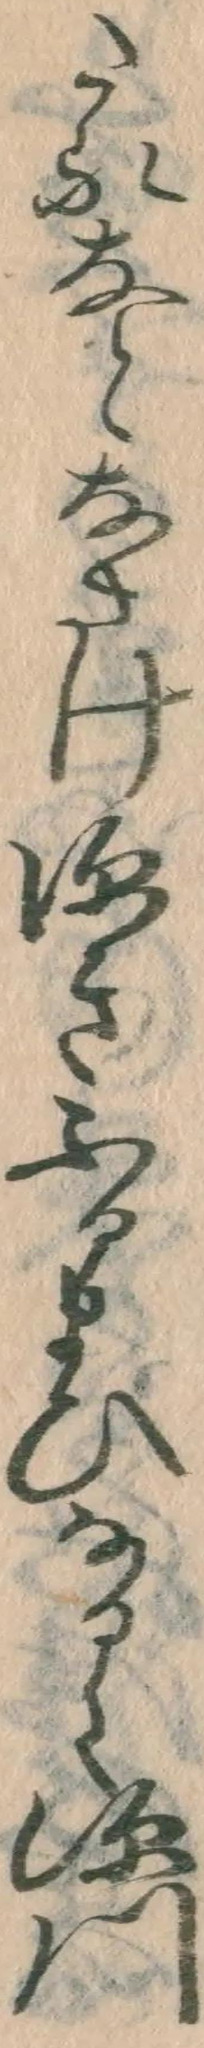たるなとなさけ深きふるまひなるに深川
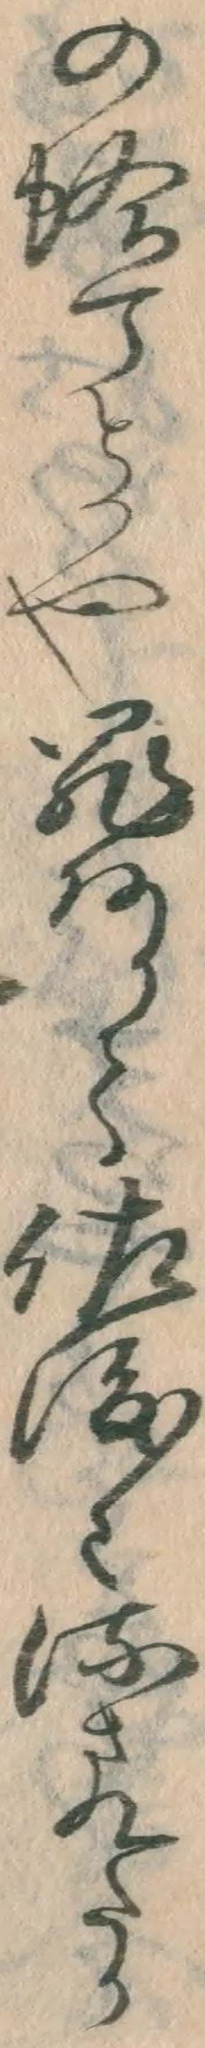の蛤丁とかや罪ありて佐渡に流されたり
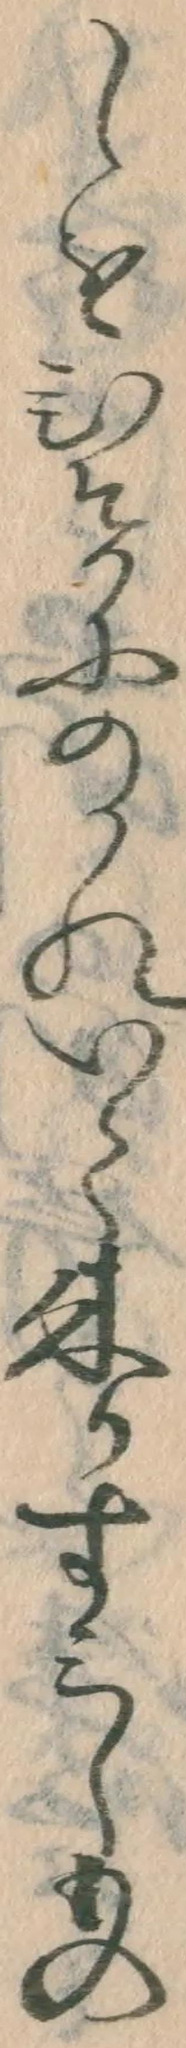しをひそかにのかれいて来りすミしもの
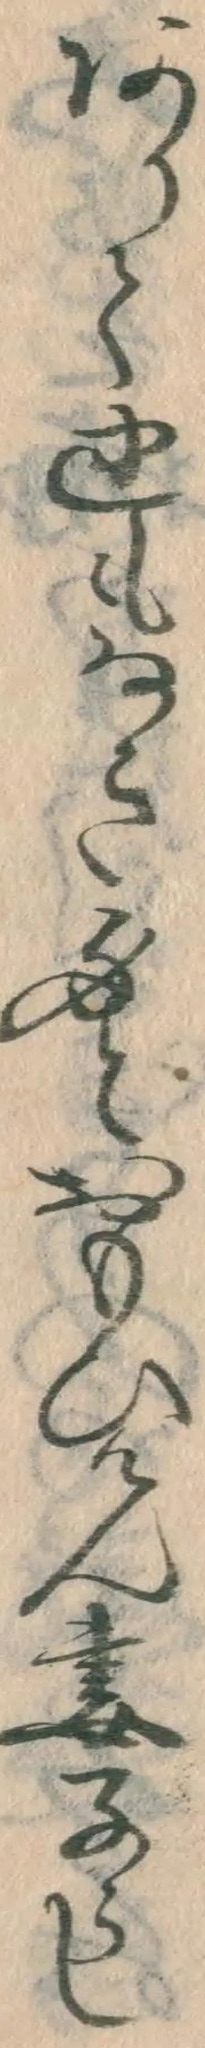ありて迚もなき身とおもひけん妻子うし
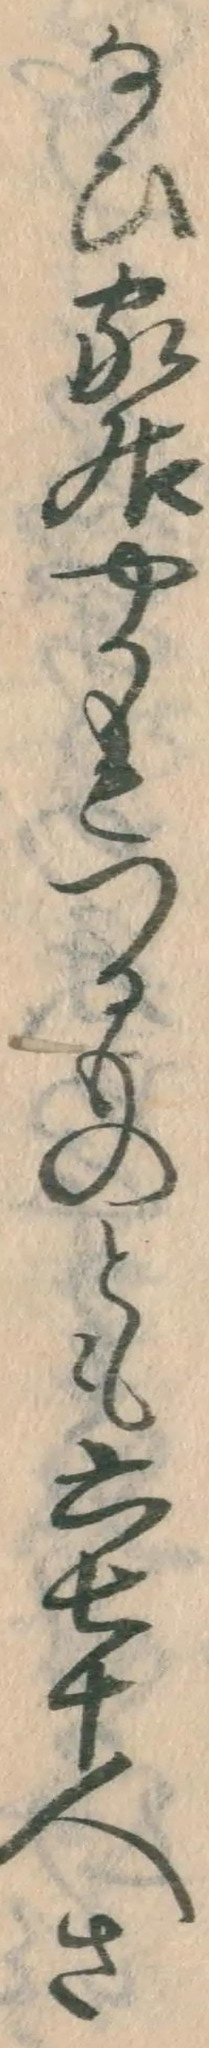なひ家居やかれつるものとも六七十人さ
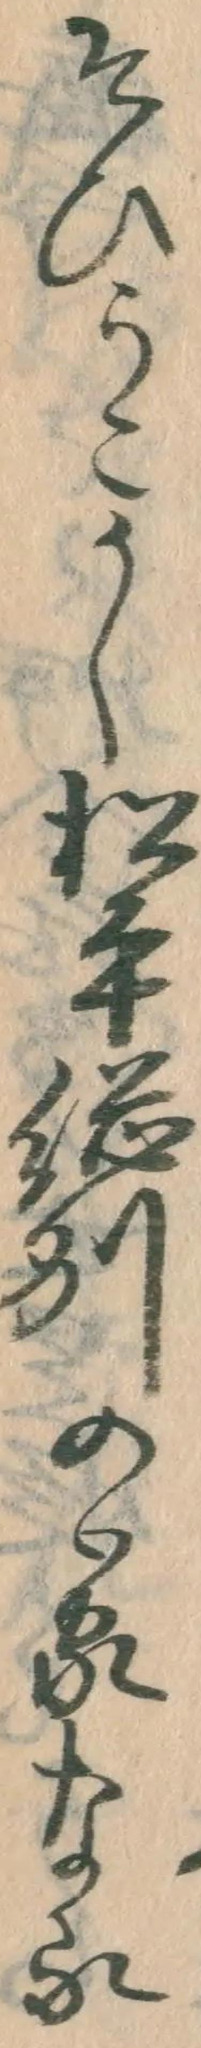そひうこかし松平総州の御家なる

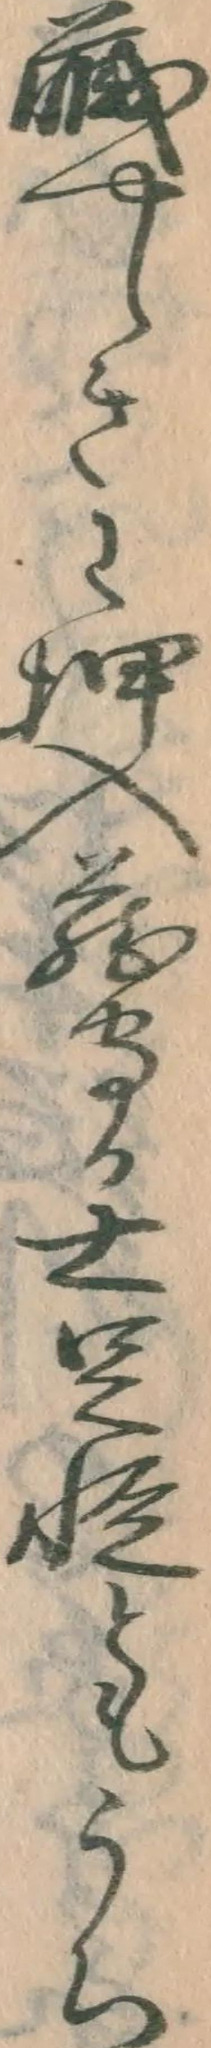蔵やしきに押入蔵守る士足輕ともうち
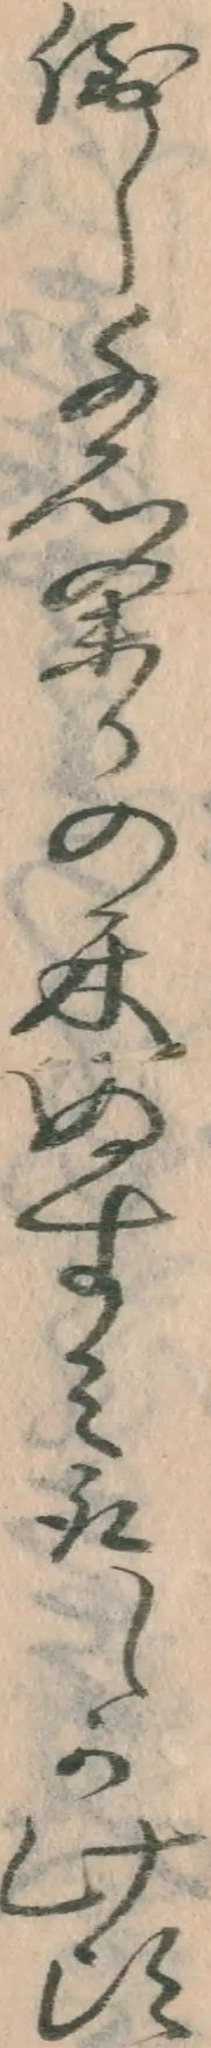倒し千石余りの米ぬすミ取しか此頃
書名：麗斎叢書. 20
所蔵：国立国会図書館 National Diet Library, JAPAN
